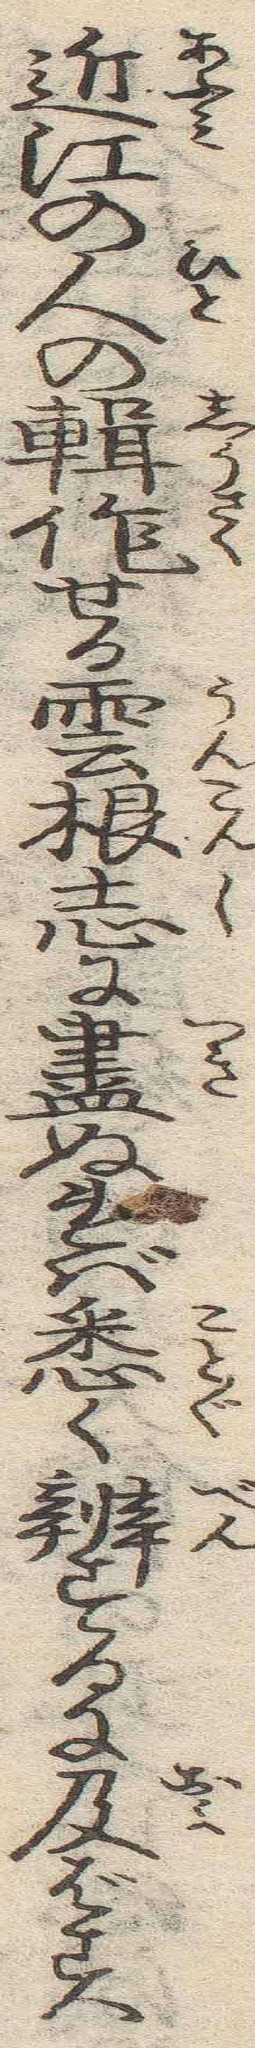近江の人の輯作せる雲根志に尽ぬれば悉く弁するに及ばす
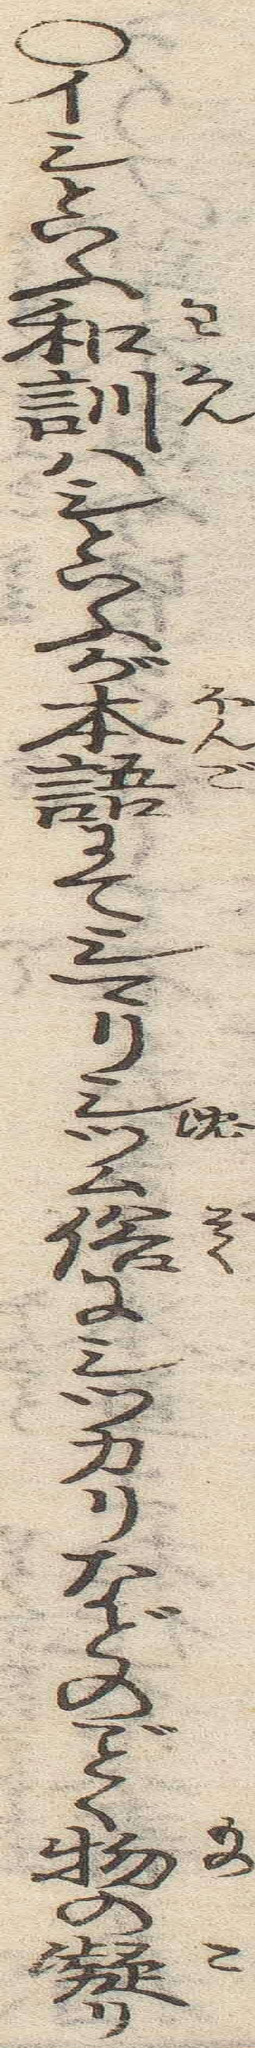○イシといふ和訓ハシといふが本語にてシマリシツム俗にシツカリなどのごとく物の凝り
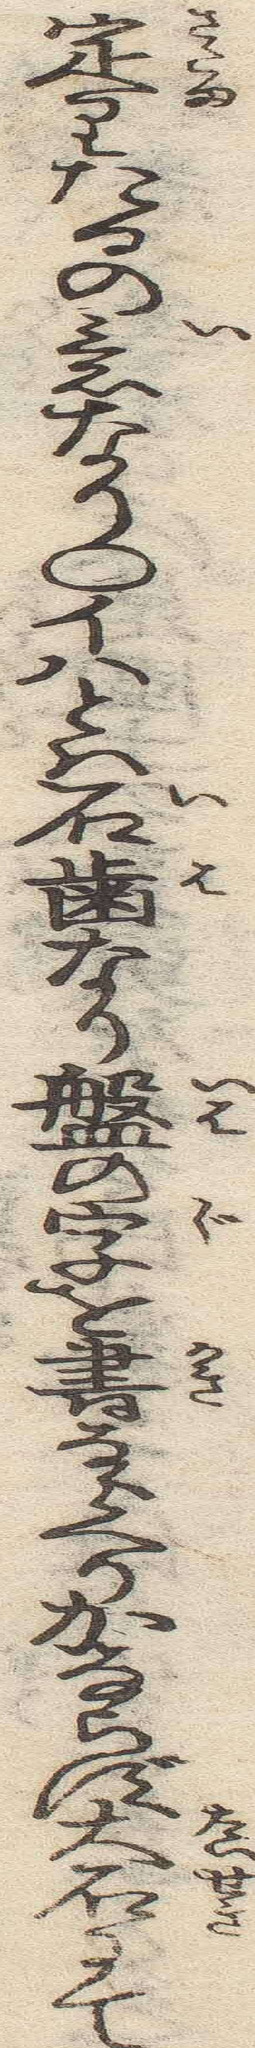定りたるの意なり○イハとは石歯なり盤の字を書ならへりかならず大石にて
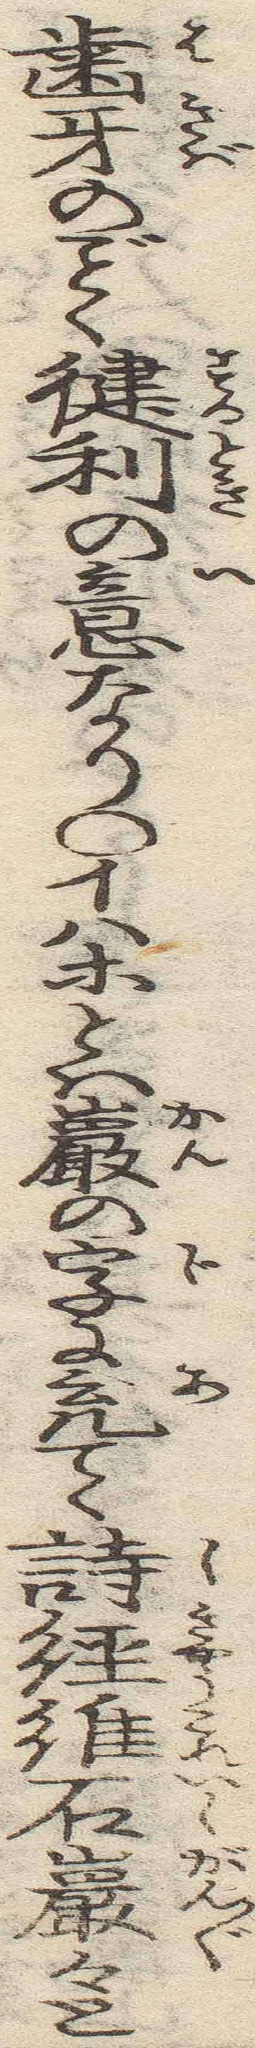歯牙のごとく健利の意なり○イハホとは巌の字に充てゝ詩経維石巌々と
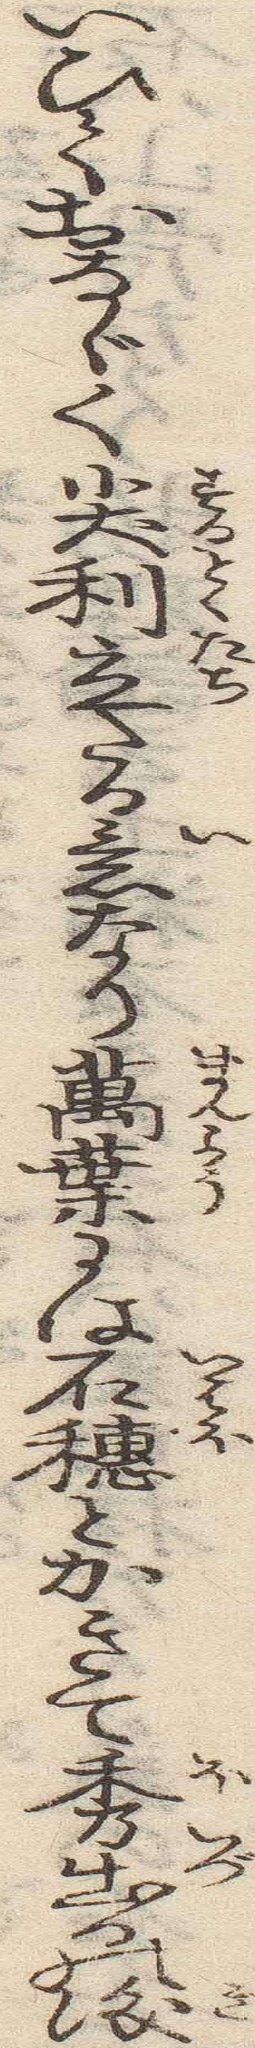いひておなじく尖利立たる意なり万葉には石穂とかきて秀出るの儀
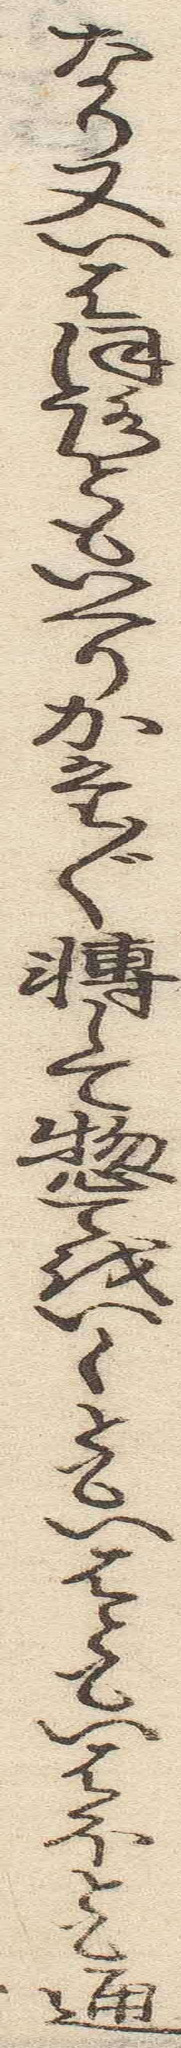なり又いはほろともいへりかた〴〵転して惣てをいしともいはともいはほとも通
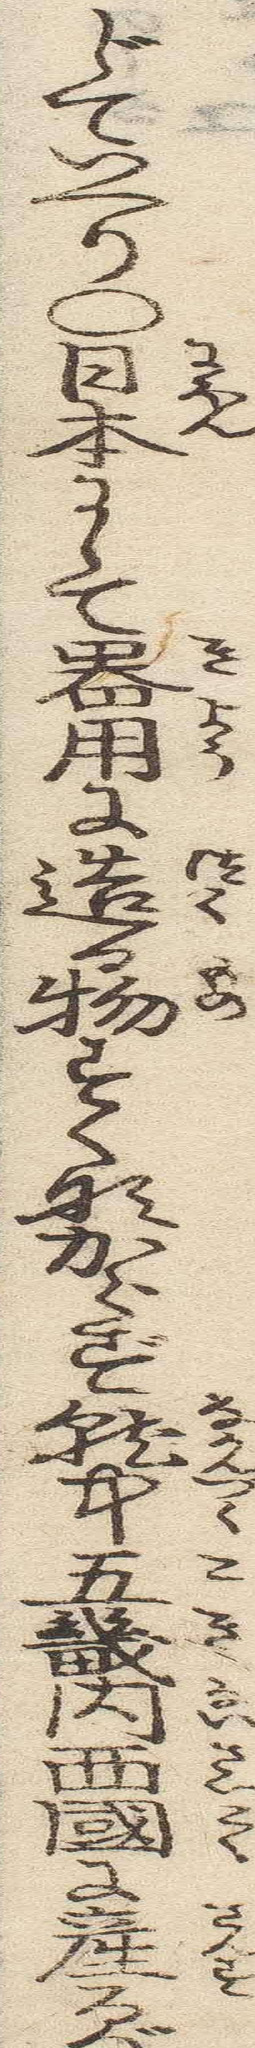じていへり○日本にして器用に造る物すくなからず就中五畿内西国に産るが
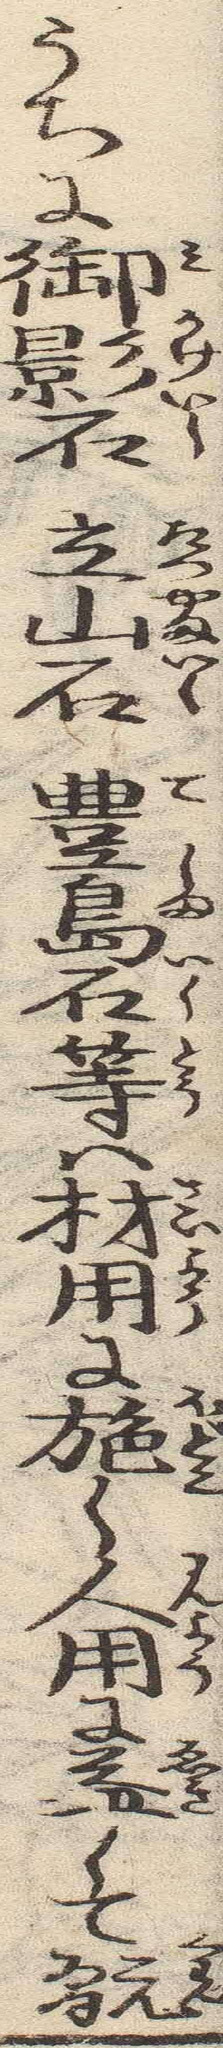うちに御影石立山石豊島石等は材用に施し人用に益して翫
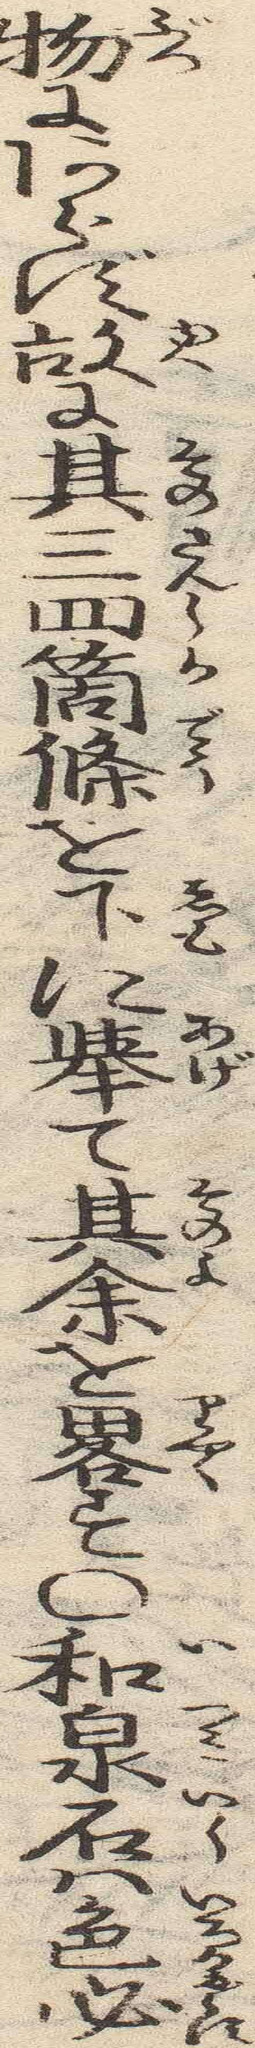物にあらず故に其三四箇條を下に挙て其余を略す○和泉石は色必
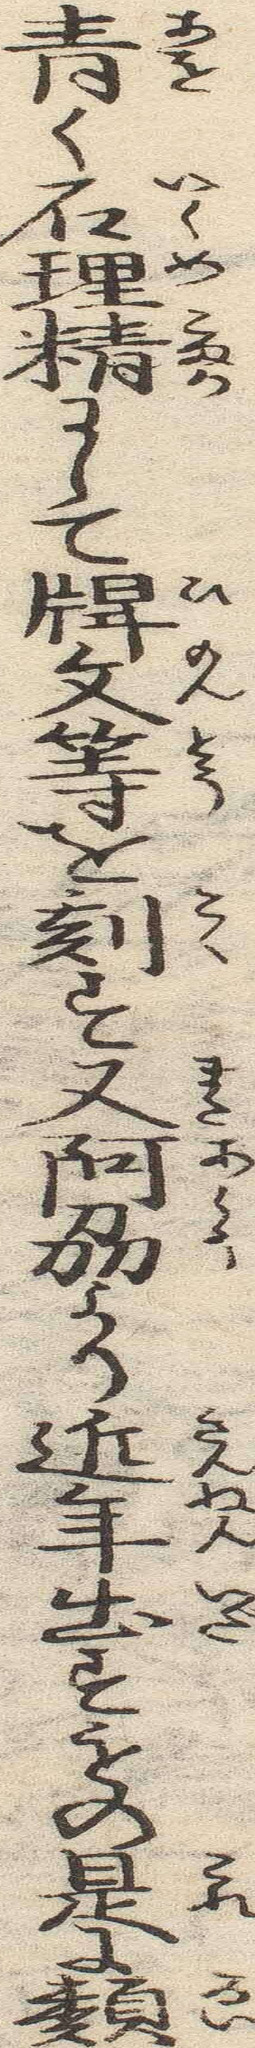青く石理精にして牌文等を刻す又阿州より近年出すもの是に類
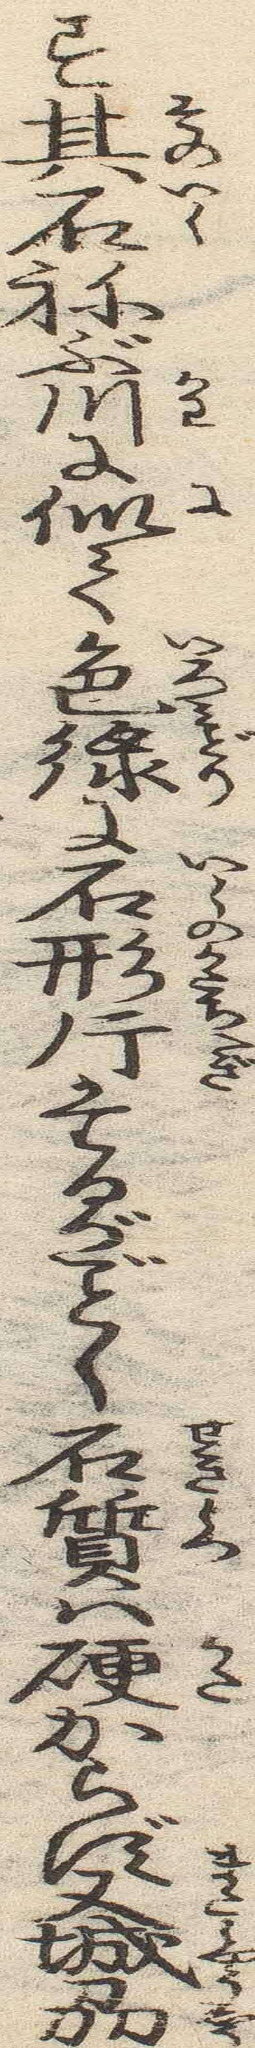す其石ねぶ川に似て色緑に石形片たるがごとし石質は硬からず又城州
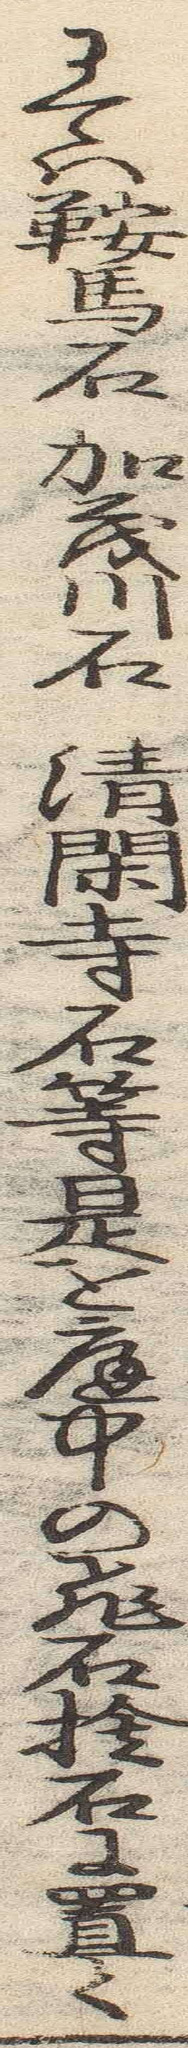にては鞍馬石加茂川石清閑寺石等是を庭中の飛石捨石に置て
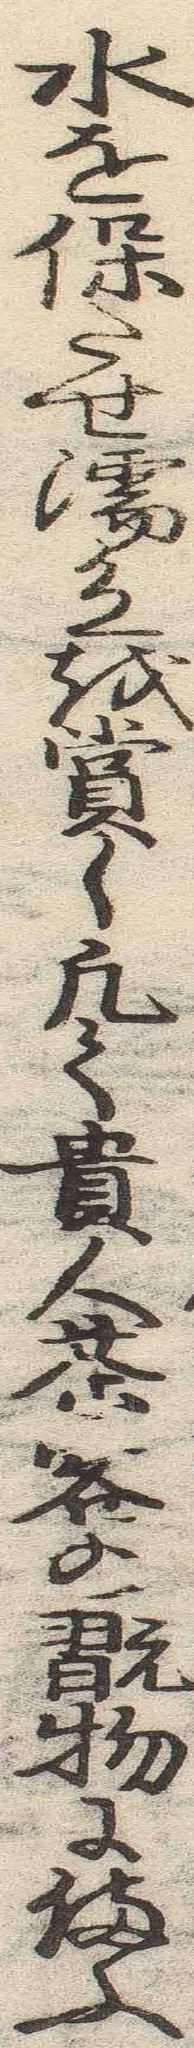水を保たせ濡色を賞し凡て貴人茶客の翫物に備ふ
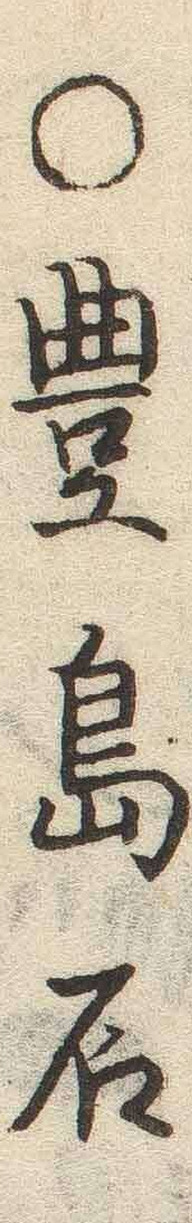○豊島石
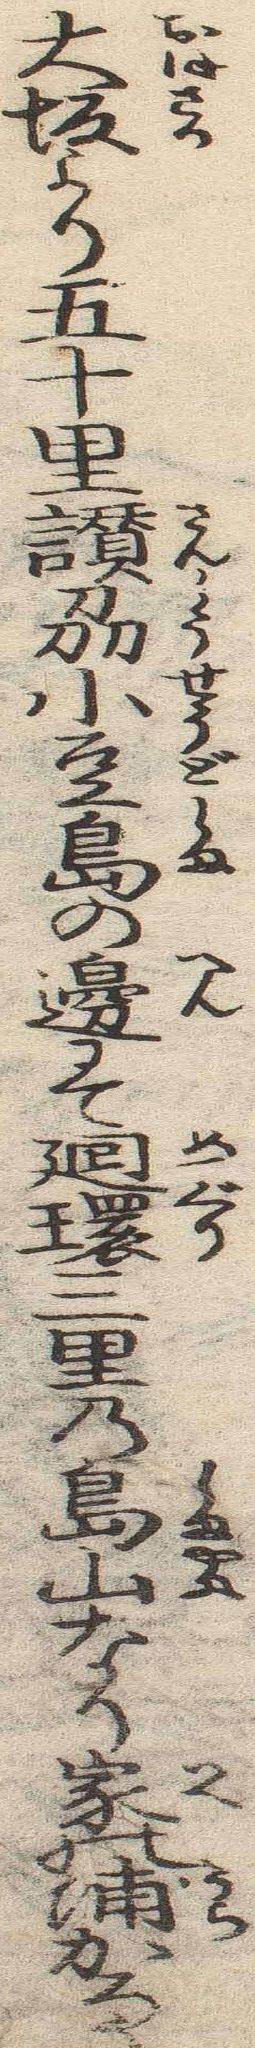大坂より五十里讃州小豆島の辺にて廻環三里の島山なり家の浦かろう
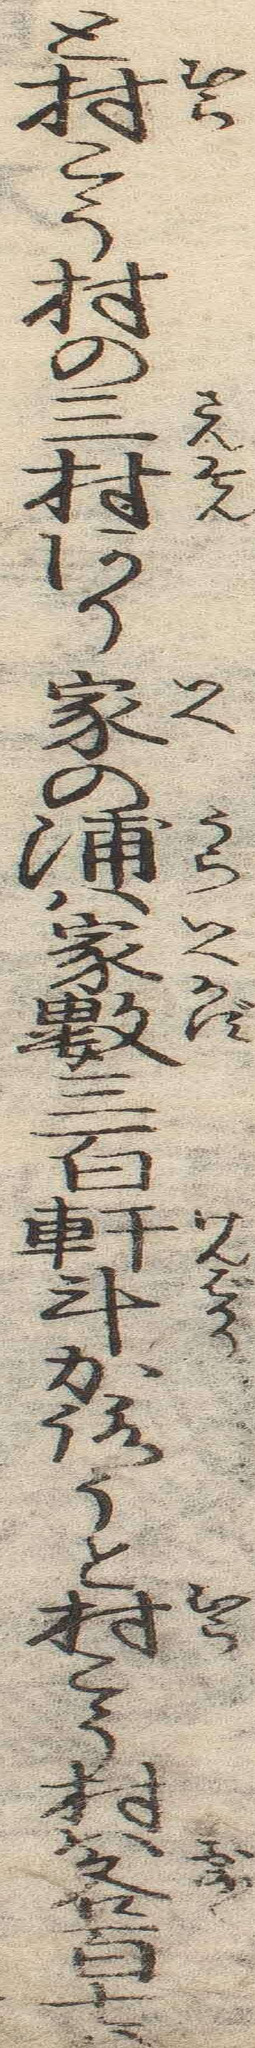と村こう村の三村あり家の浦は家数三百軒斗かろうと村こう村は各百七八
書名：日本山海名産図会
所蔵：東京学芸大学附属図書館 国文学研究資料館
